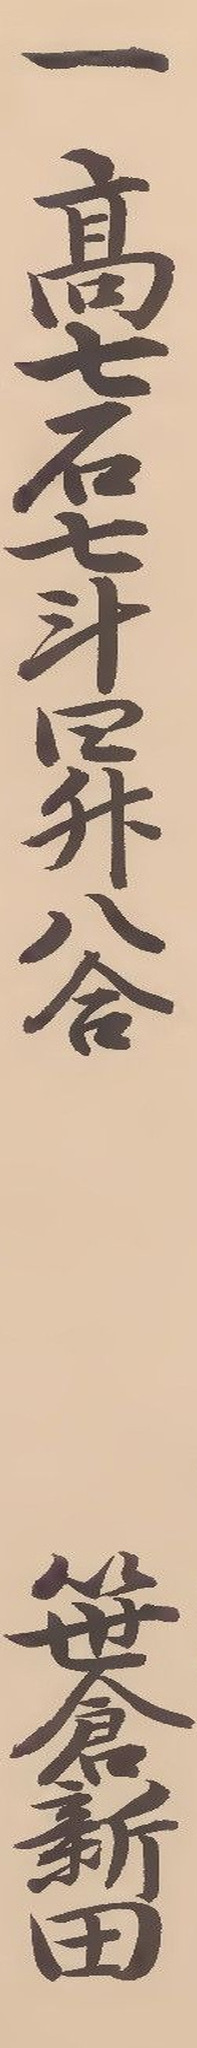一高七石七斗四升八合笹倉新田
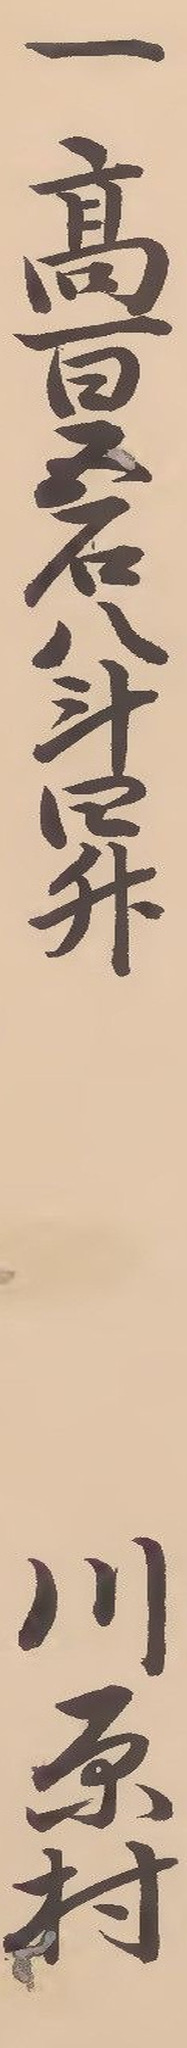一高百五石八斗四升川原村

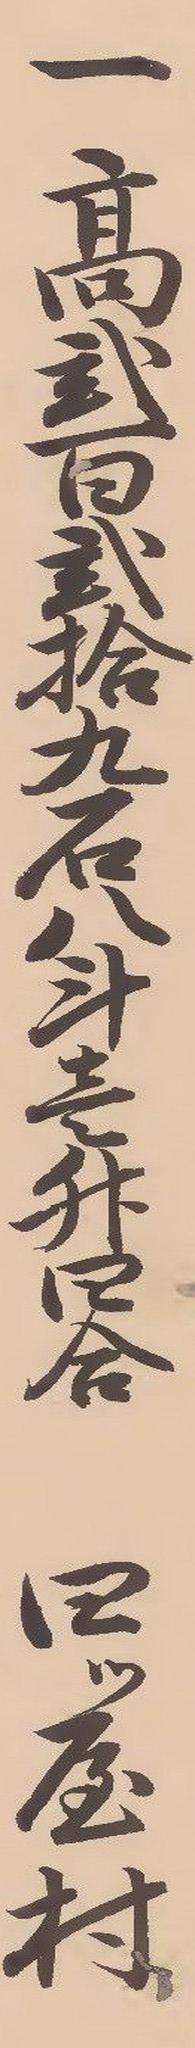一高弐百弐拾九石八斗壱升四合四ツ屋村
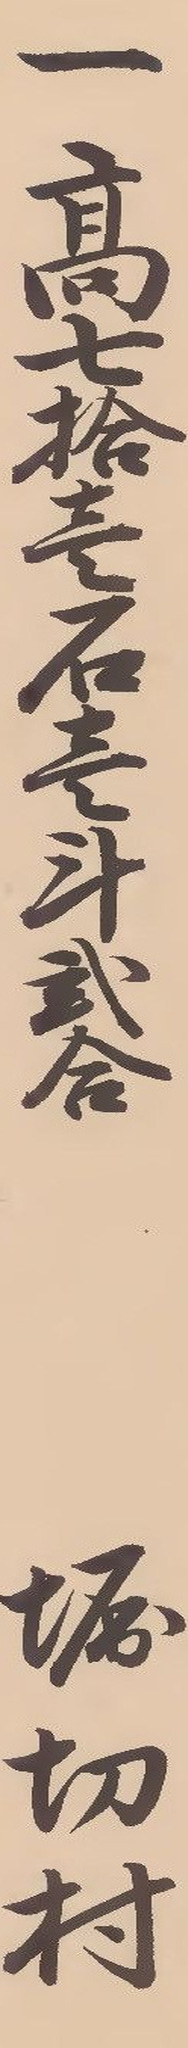一高七拾壱石壱斗弐合堀切村
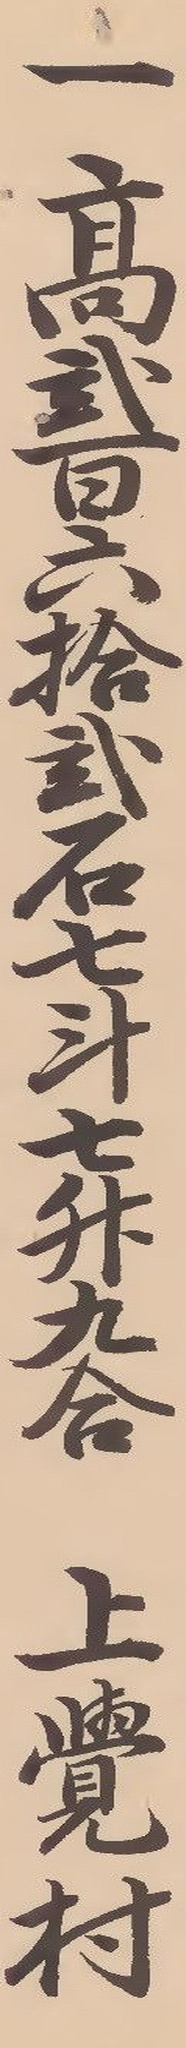一高弐百六拾弐石七斗七升九合上覚村
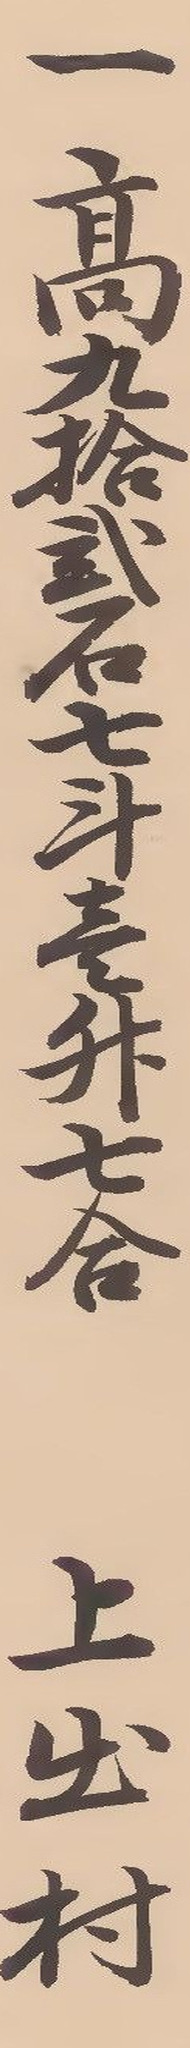一高九拾弐石七斗壱升七合上出村
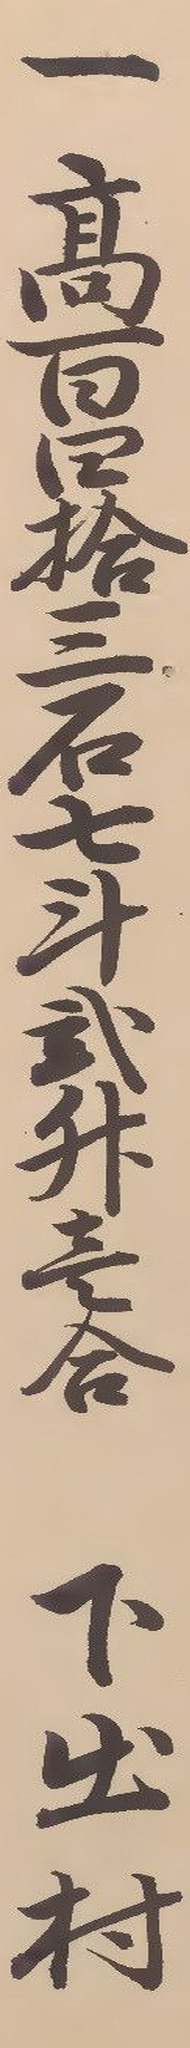一高百四拾三石七斗弐升壱合下出村
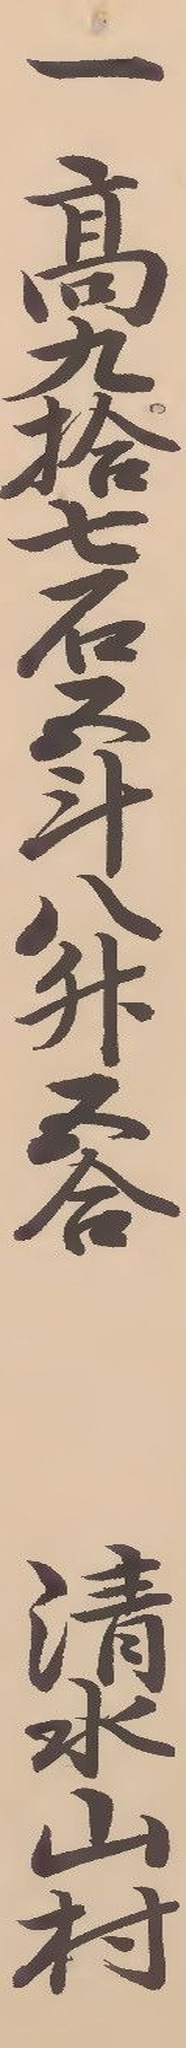一高九拾七石五斗八升五合清水山村
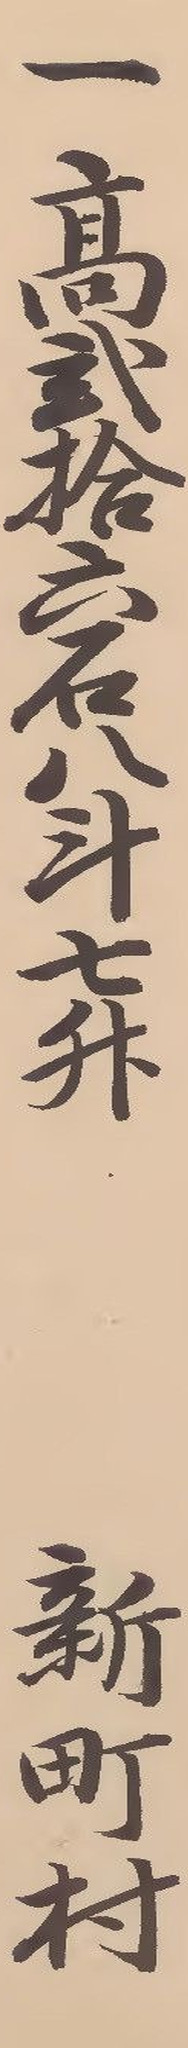一高弐拾六石八斗七升新町村
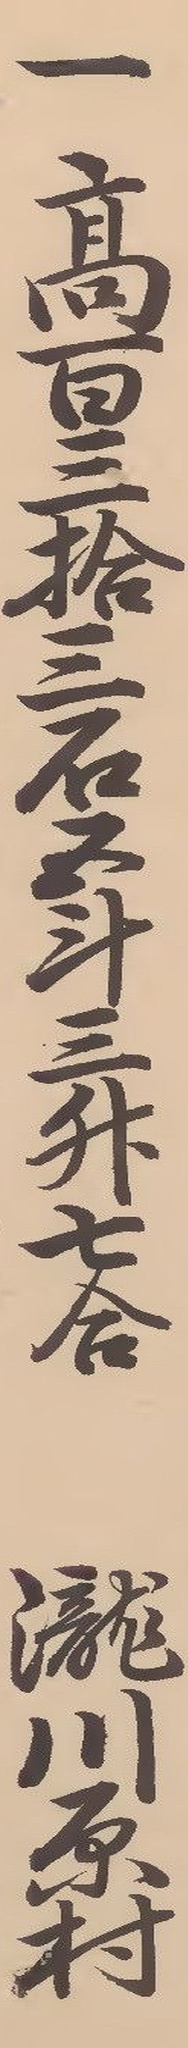一高百三拾三石五斗三升七合滝川原村

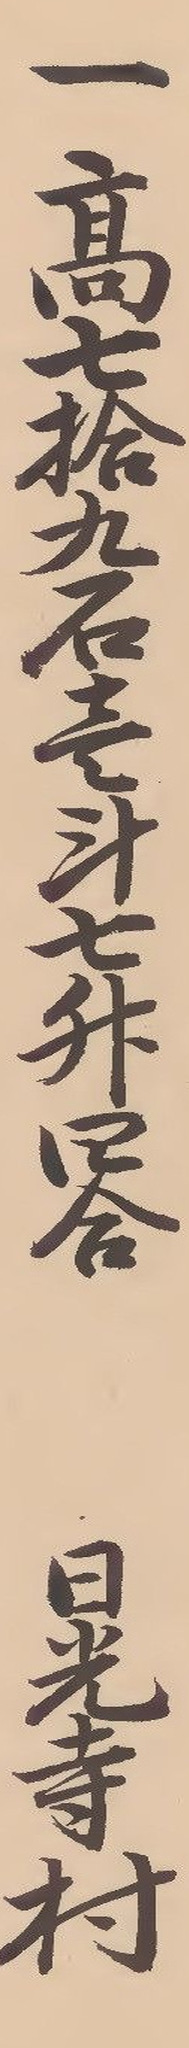一高七拾九石壱斗七升四合日光寺村
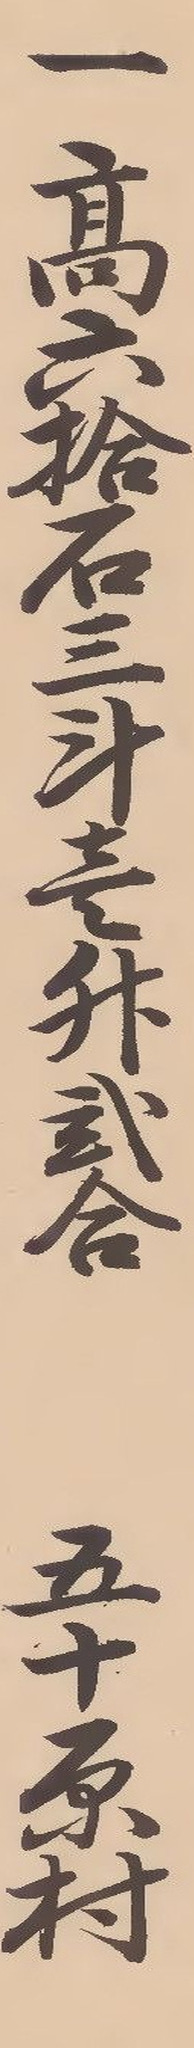一高六拾石三斗壱升弐合五十原村
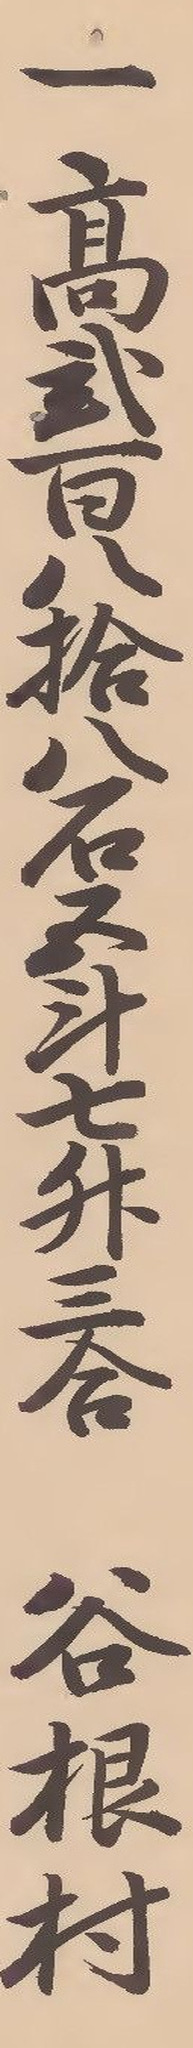一高弐百八拾八石五斗七升三合谷根村
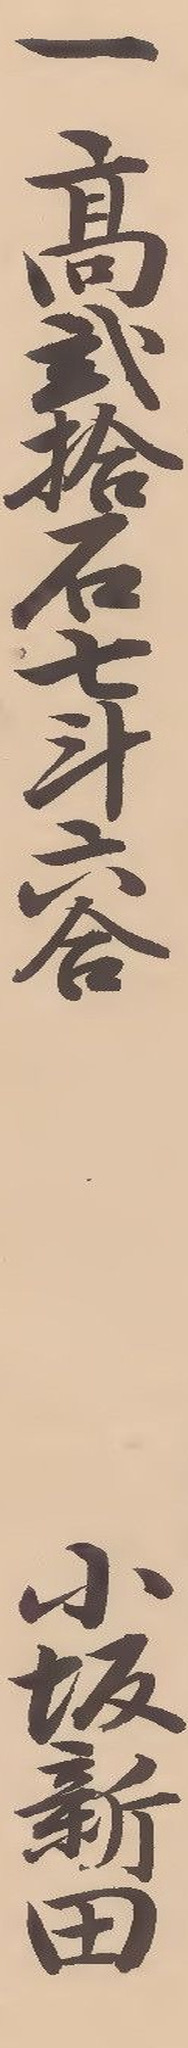一高弐拾石七斗六合小坂新田
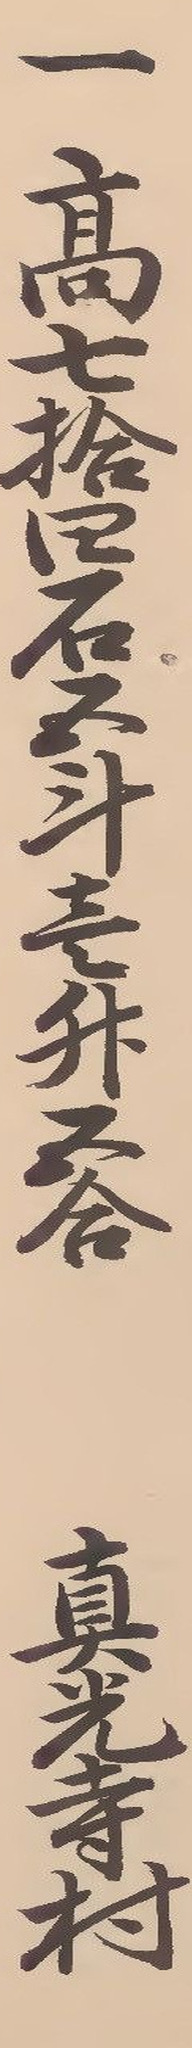一高七拾四石五斗壱升五合真光寺村
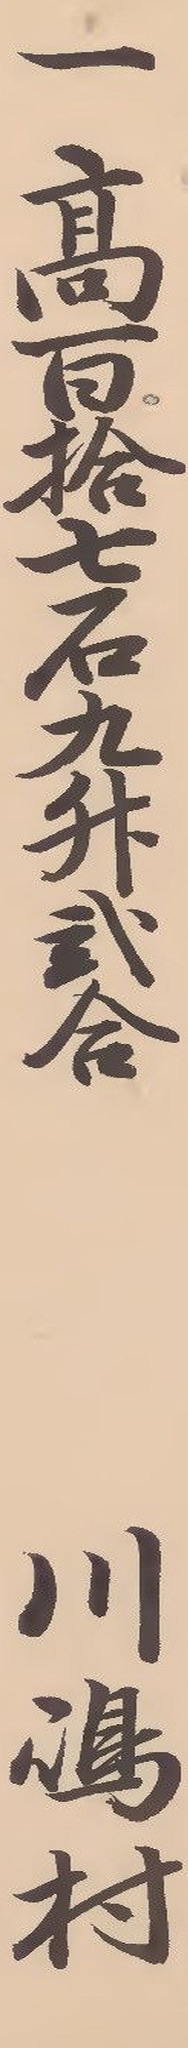一高百拾七石九升弐合川島村
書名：越後国郷帳　上
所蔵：国立公文書館 National Archives of Japan
